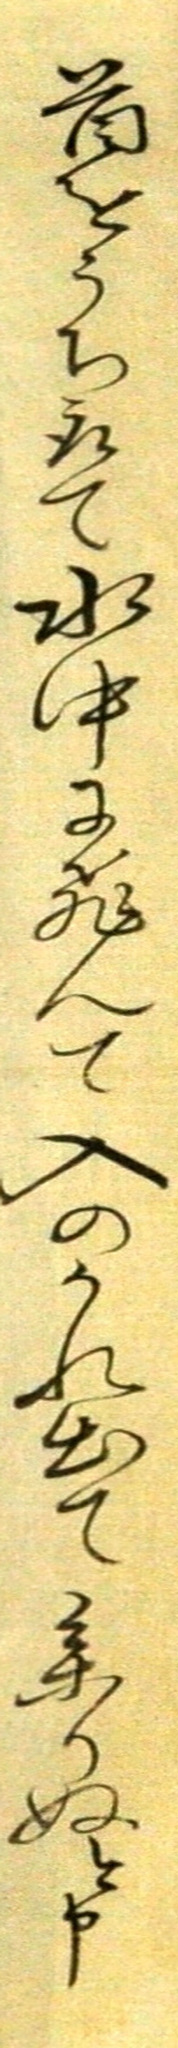首をうち取て水中に飛んて入のかれ出て参りぬと申
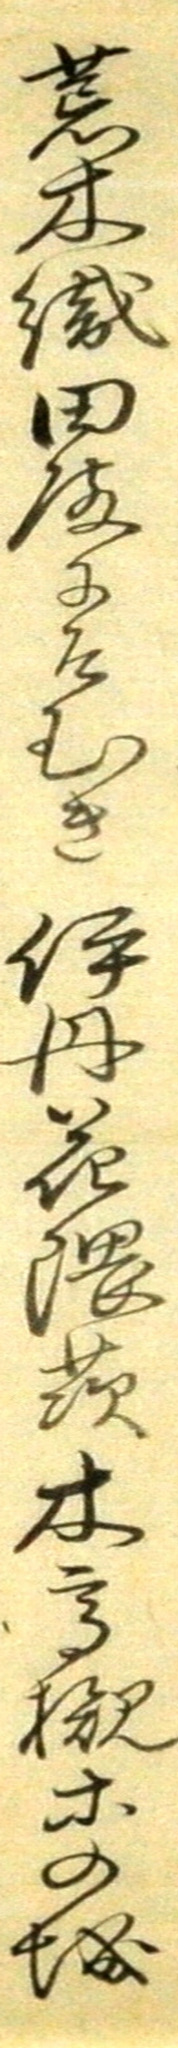荒木織田殿にそむき伊丹花隈茨木高槻等の城
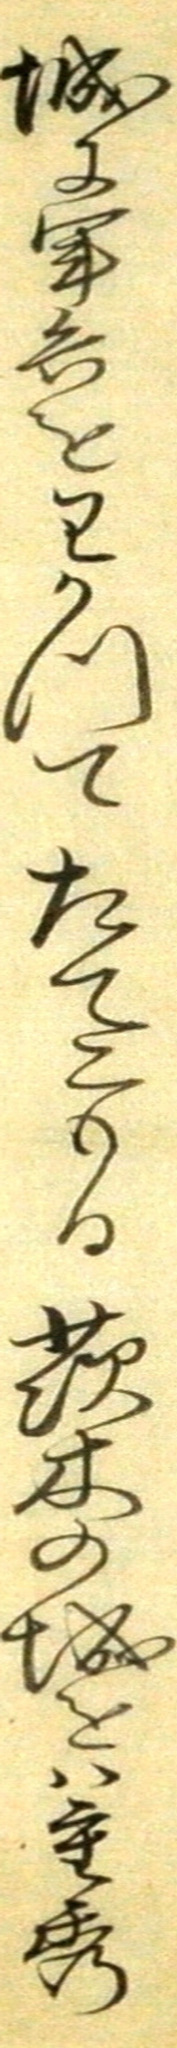城に軍兵をわかつてたてこもる茨木の城をは重秀
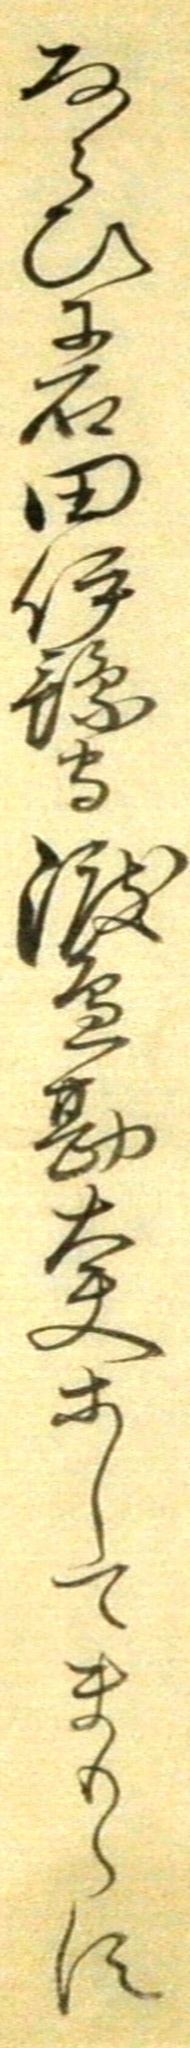ならひに石田伊予守渡辺勘大夫等してまもらす
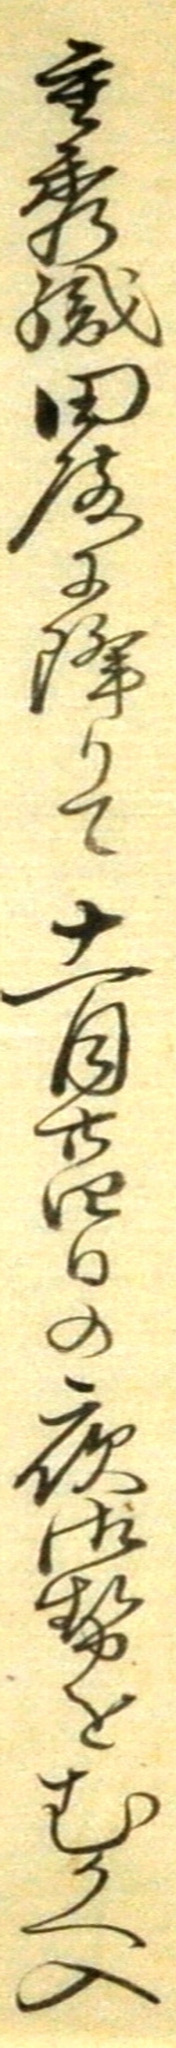重秀織田殿に降りて十一月廿四日の夜御勢をむかへ入
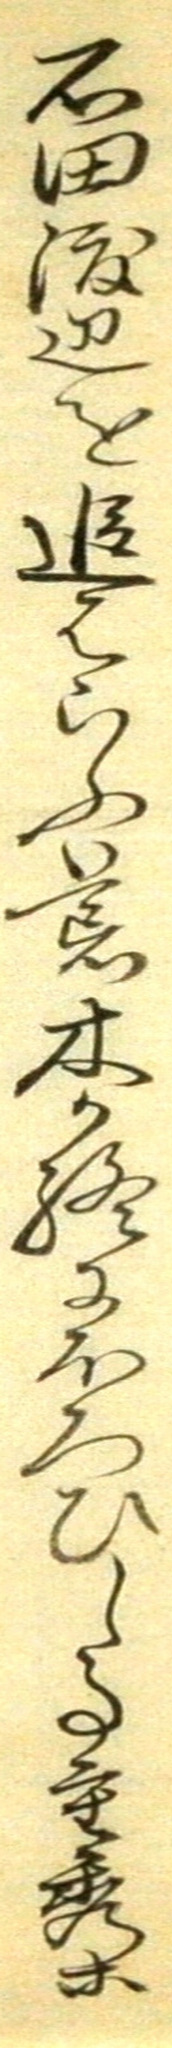石田渡辺を追はらふ荒木か終にほろひし事重秀等
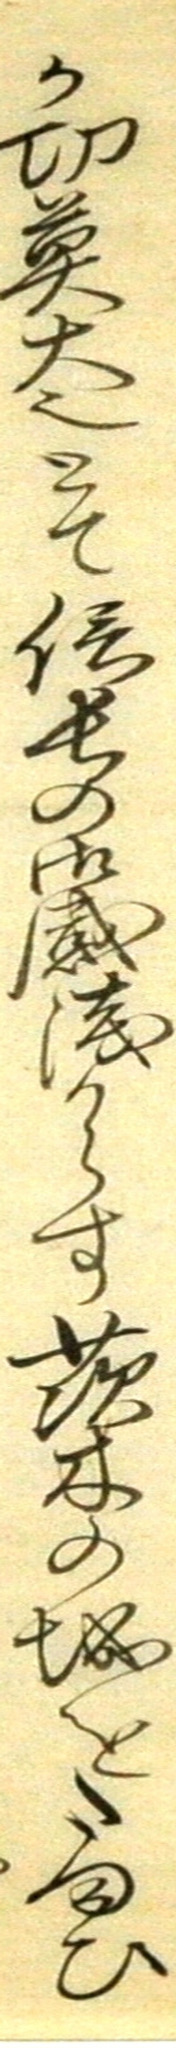か功莫大也とて信長の御感浅からす茨木の城をたまひ
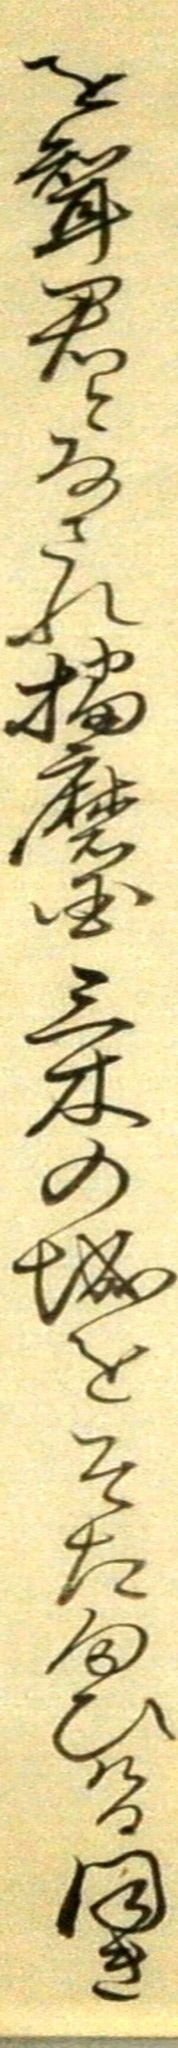を聟君となされ播磨国三木の城をそたまひける同き
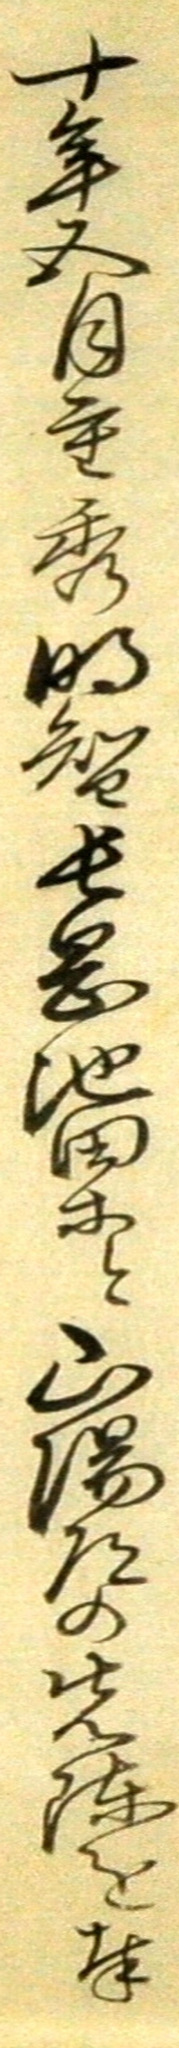十年五月重秀明智長岡池田等と山陽道の先陣を奉
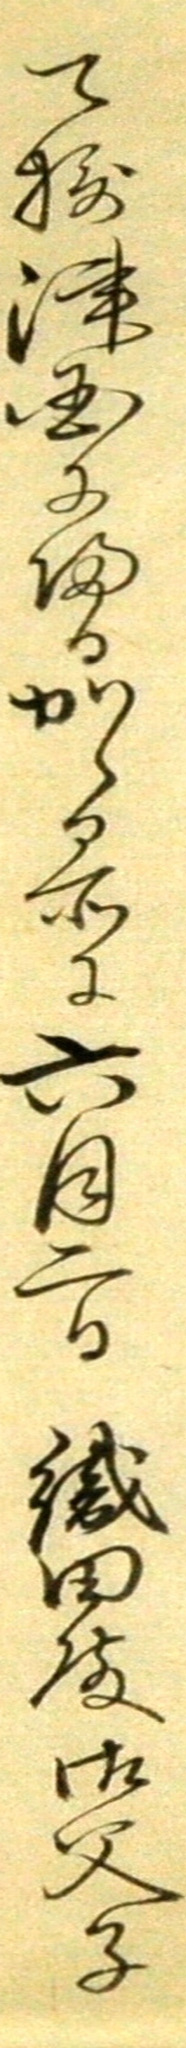て摂津国に帰るかゝる所に六月二日織田殿御父子
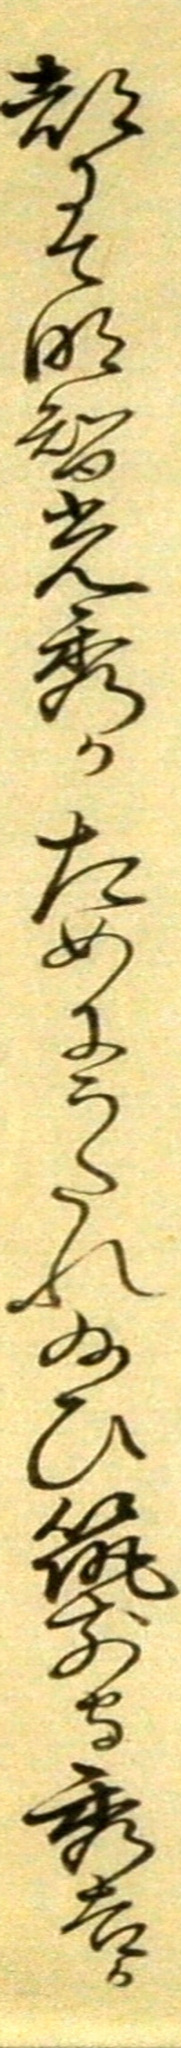都にて明智光秀かためにうたれ給ひ筑前守秀吉か
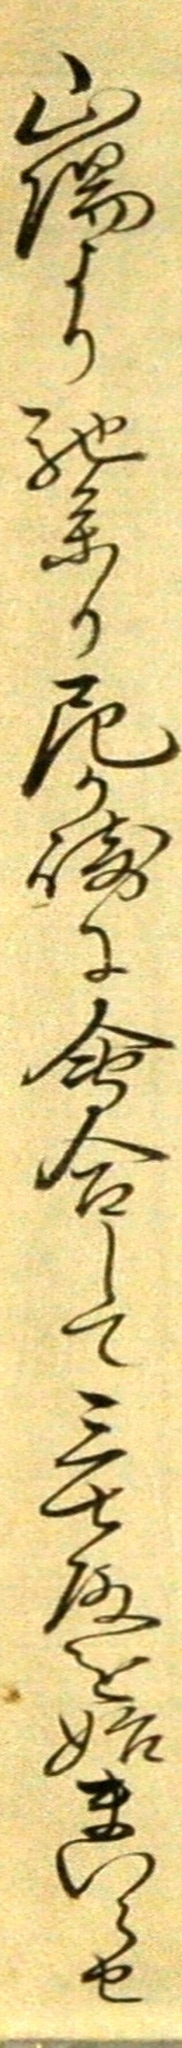山陽より馳参り尼か崎に会合して三七殿を始まいらせ

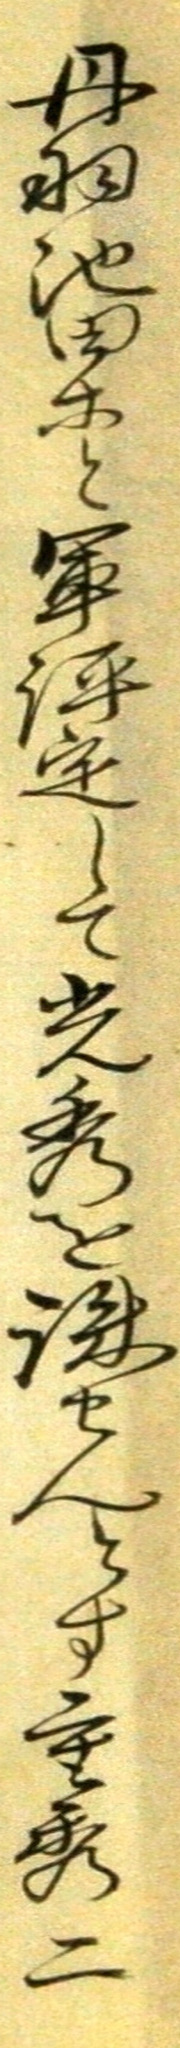丹羽池田等と軍評定して光秀を誅せんとす重秀二
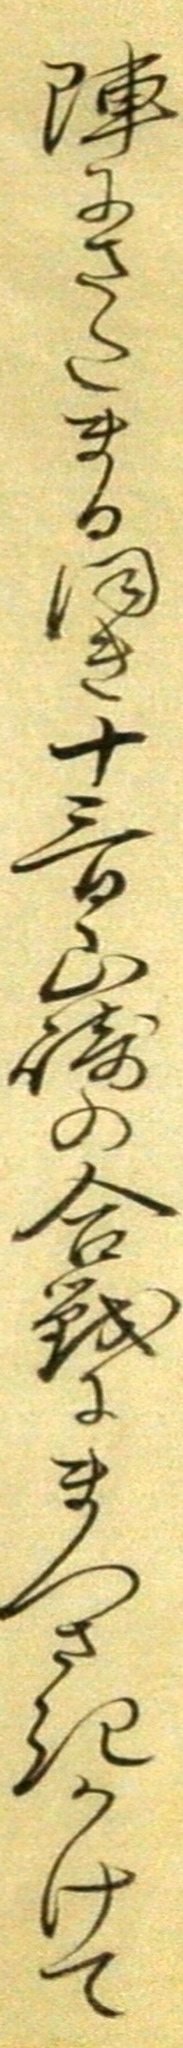陣にさたまる同き十三日山崎の合戦にまつさきかけて
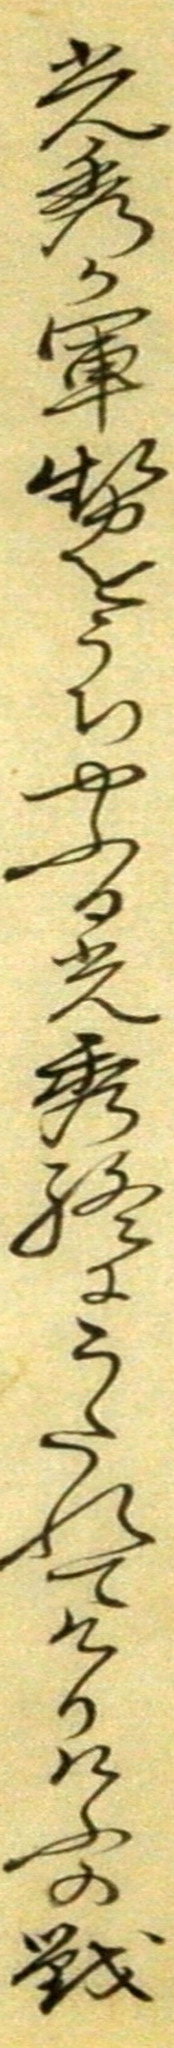光秀か軍勢をうちやふる光秀終にうたれてけりけふの戦
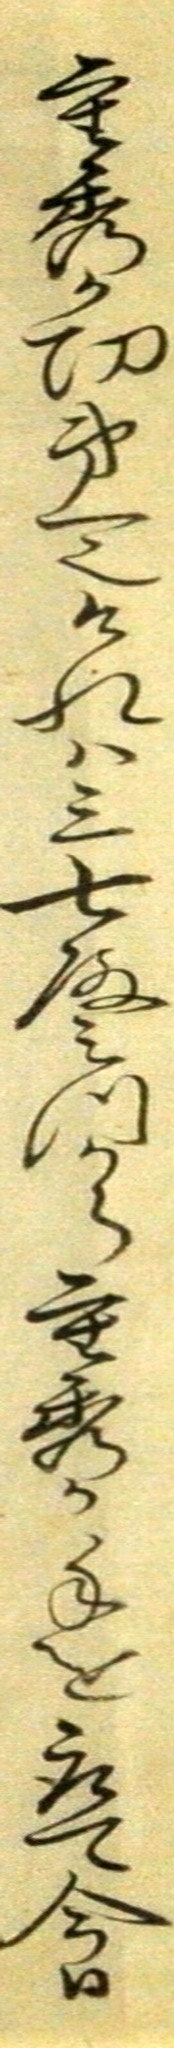重秀か功第一也けれは三七殿みつから重秀か手を取て今日
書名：藩翰譜（九・下）
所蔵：伊那市立高遠町図書館・合同会社AMANE
